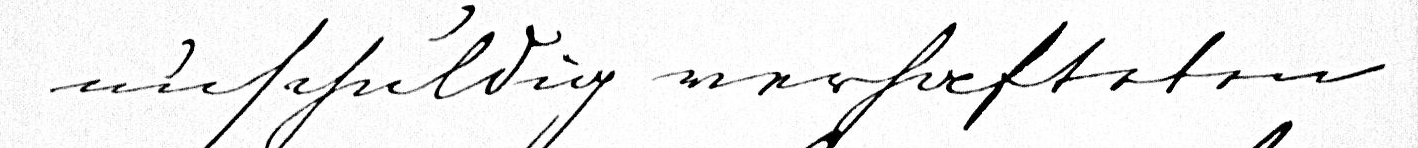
unschuldig verhafteten
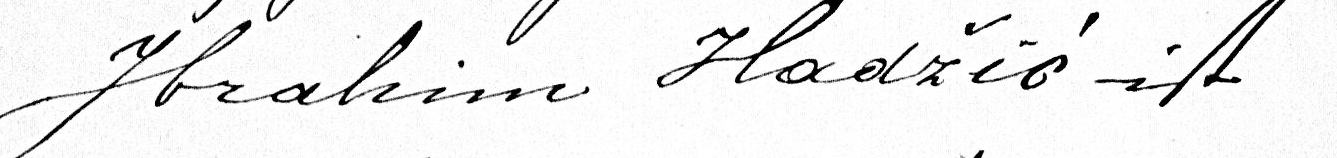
Ibrahim Hadzić ist
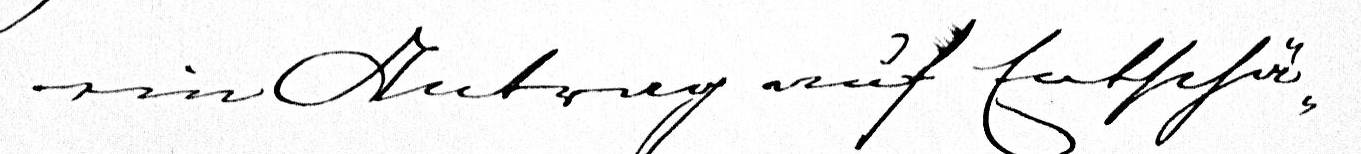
ein Antrag auf Entschä¬
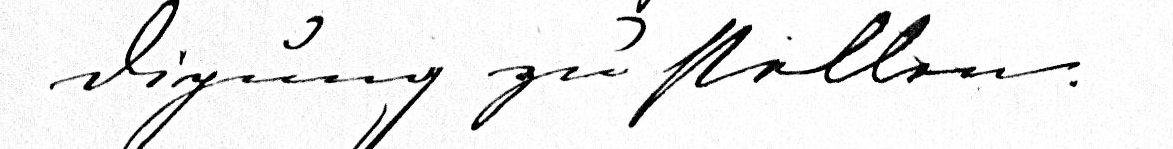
digung zu stellen.
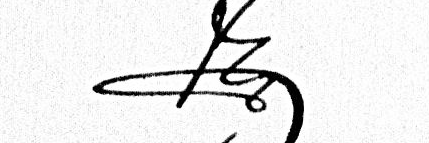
xx
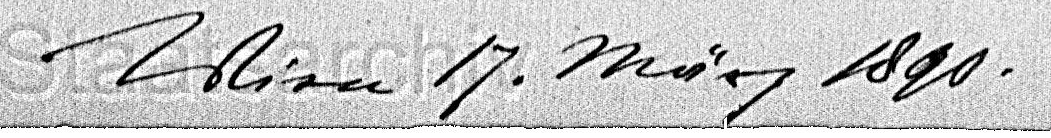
Wien 17. März 1890.
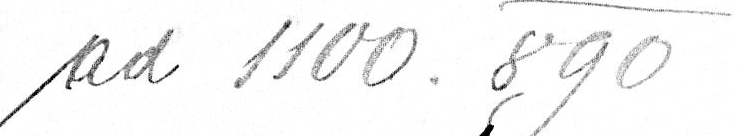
ad 1100.890
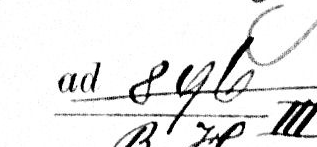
ad 896
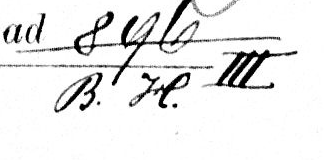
B. H. III
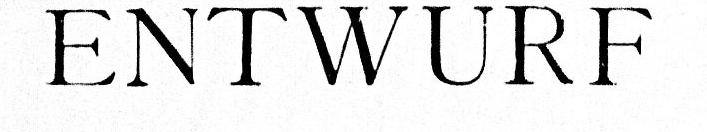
ENTWURF
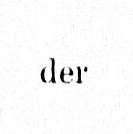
der
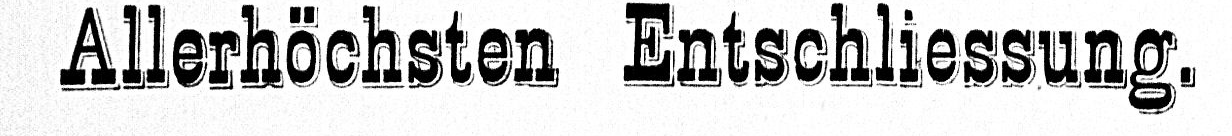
Allerhöchsten Entschliessung.
